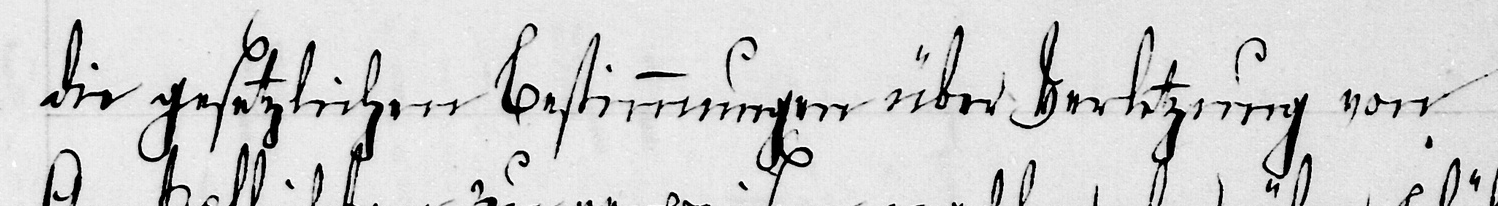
die gesetzlichen Bestimmungen über Verletzung von
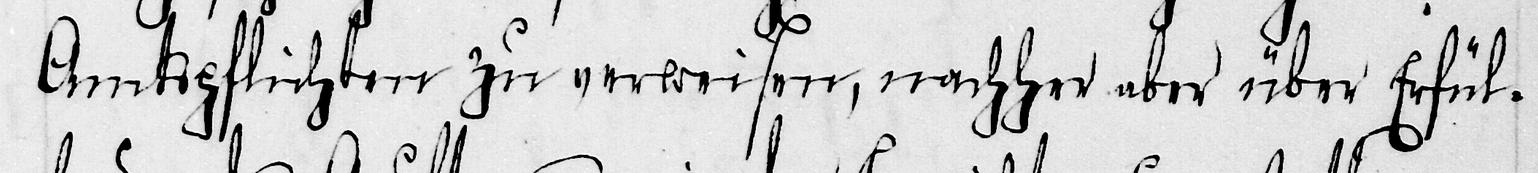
Amtspflichten zu verweisen, nachher aber über Erfül¬
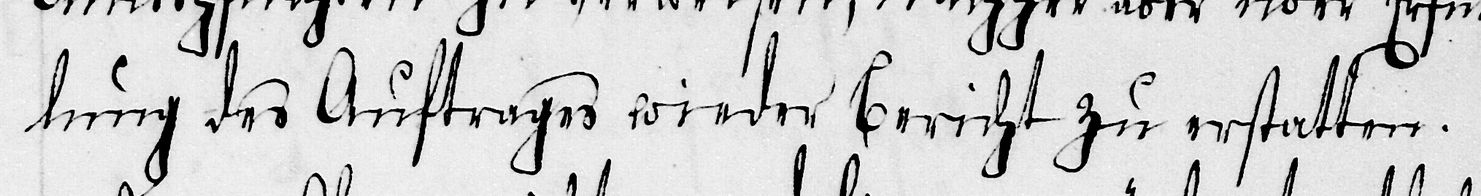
lung des Auftrages wieder Bericht zu erstatten.
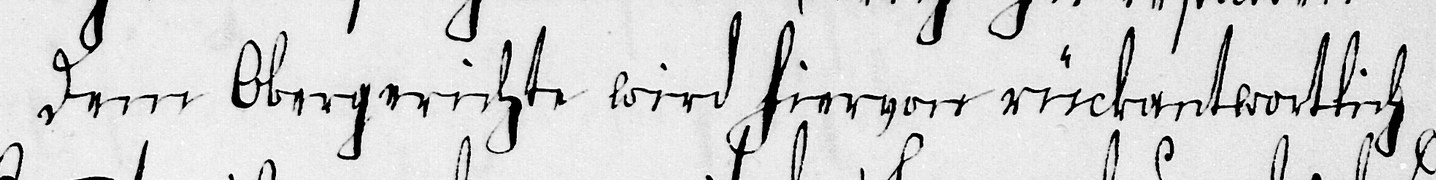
Dem Obergerichte wird hiervon rückantwortlich
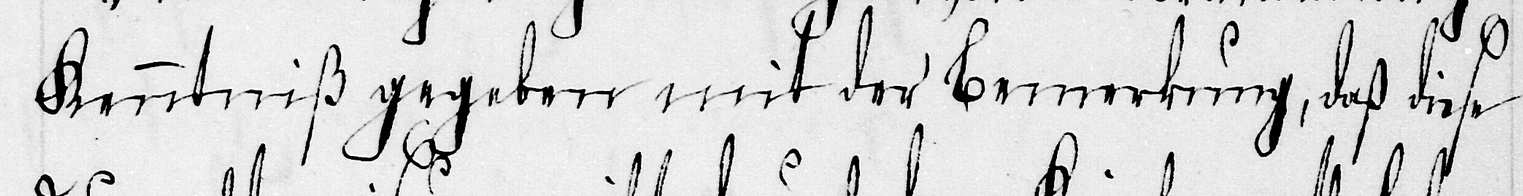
Kenntniß gegeben mit der Bemerkung, daß diese
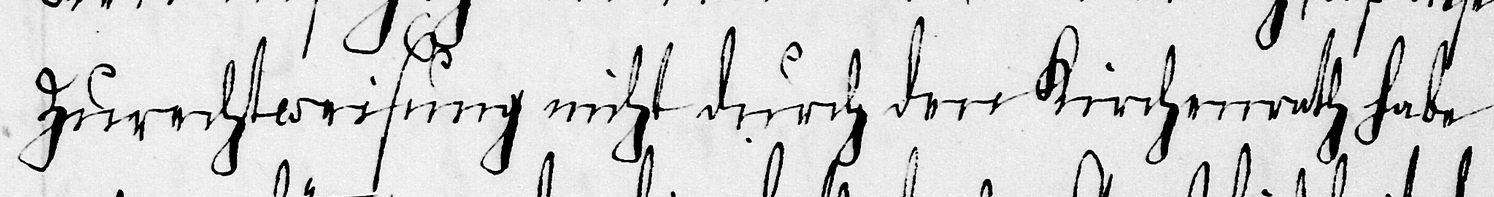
Zurechtweisung nicht durch den Kirchenrath habe
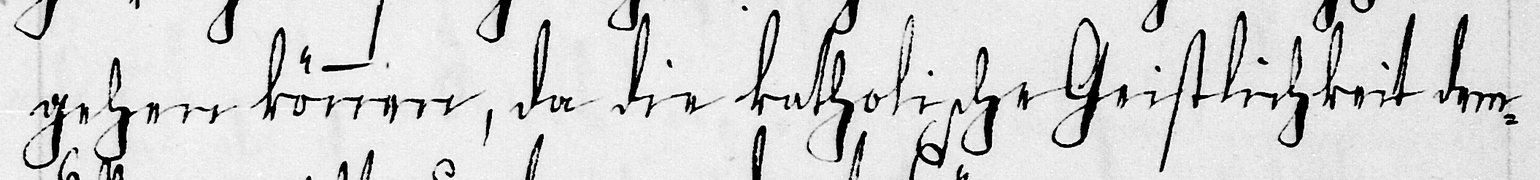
gehen können, da die katholische Geistlichkeit dem¬
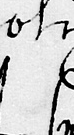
d.
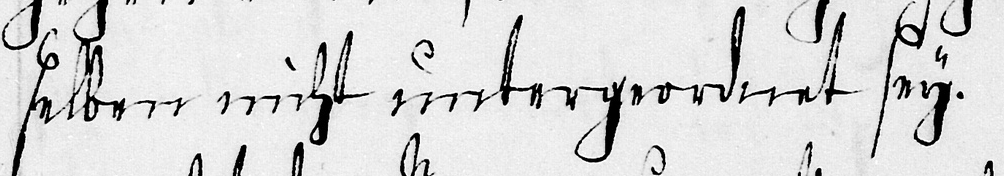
selben nicht untergeordnet sey.
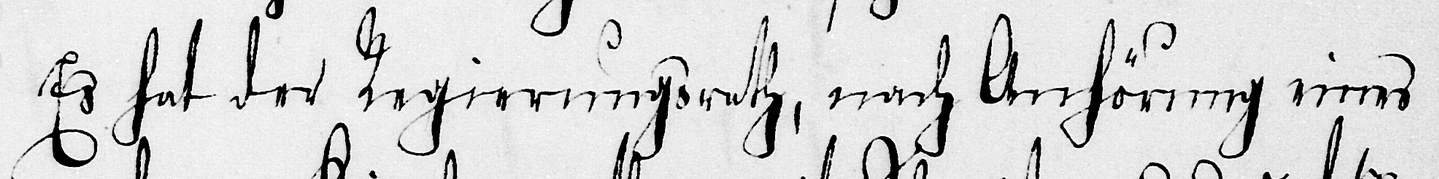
Es hat der Regierungsrath, nach Anhörung eines
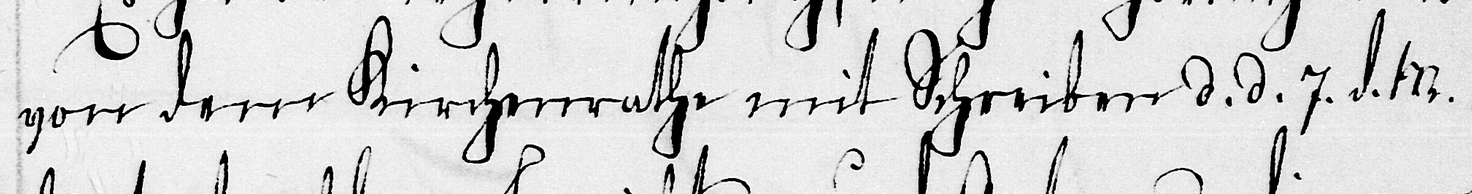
von dem Kirchenrathe mit Schreiben d. d. 7. d. M.
